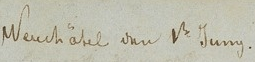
Neuchâtel den 1sten Juny.
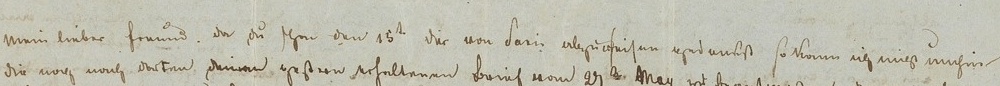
Mein lieber Freund. Da du schon den 15t dies von Paris abzureisen gedenkst so kann ich nicht umhin
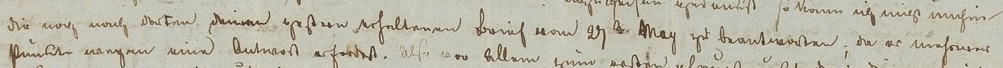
dir noch nach dorten deinen gestern erhaltenen Brief vom 27t May zu beantworten; da er mehrerer
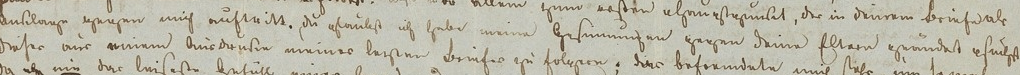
Anklage gegen mich auftritt. Du glaubst ich habe meine Gesinnungen gegen deine Eltern geändert & suchst
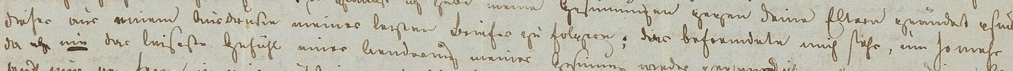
dieses aus einem Ausdruke meines lezten Briefes zu folgern; das befremdete mich sehr, um so mehr
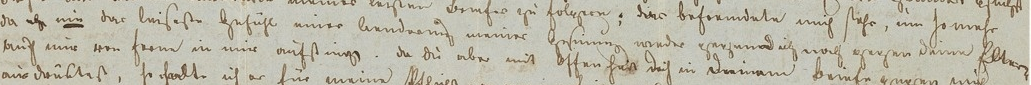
da ichnie das leiseste Gefühl einer Aenderung meiner Gesinnung weder gegen dich noch gegen deine Eltern
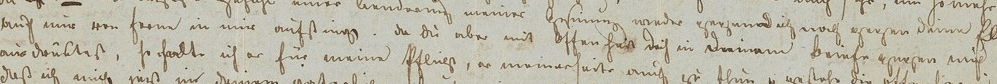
auch nur von ferne in mir aufstieg. Da du aber mit Offenheit dich in deinem Briefe gegen mich
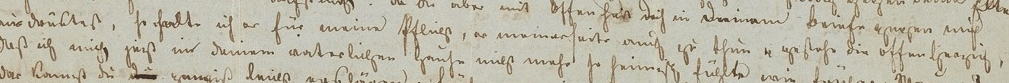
ausdrüktest, so halte ich es für meine Pflicht, es meinerseits auch zu thun & gestehe dir offenherzig,
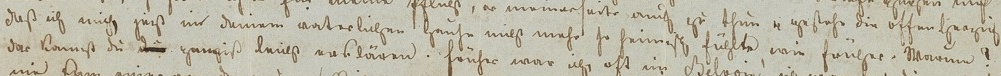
daß ich mich jezt in deinem väterlichen Hause nicht mehr so heimisch fühlte, wie früher. Warum?
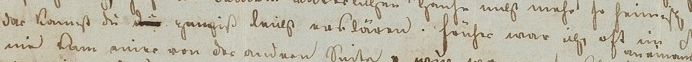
Das kannst du dir gewiß leicht erklären. Früher war ich oft im
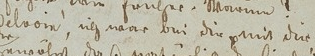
Belvoir, ich war bei dir & mit dir &
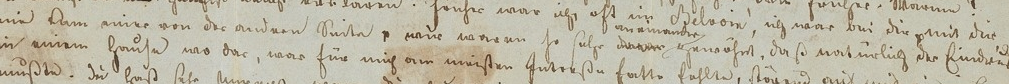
nie kam einer von der andern Seite & wir waren so sehr darananeinander gewöhnt, daß natürlich der Eindruk
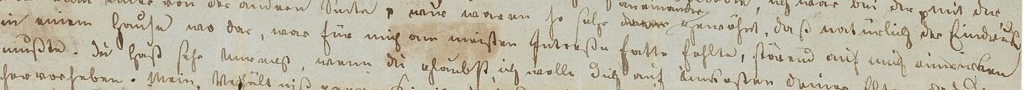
in einem Hause wo das, was für mich am meisten Intreße hatte fehlte, störend auf mich einwirken
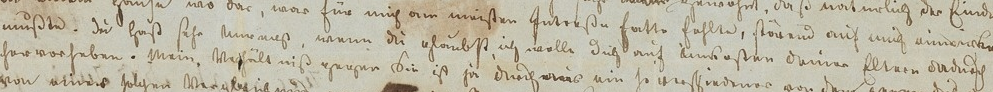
mußte. Du hast sehr Unrecht, wenn du glaubst, ich wolle dich auf Unkosten deiner Eltern dadurch
